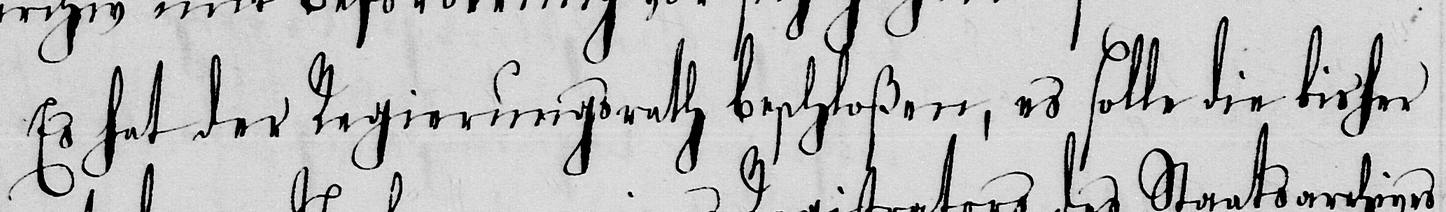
Es hat der Regierungsrath beschloßen, es solle die bisher
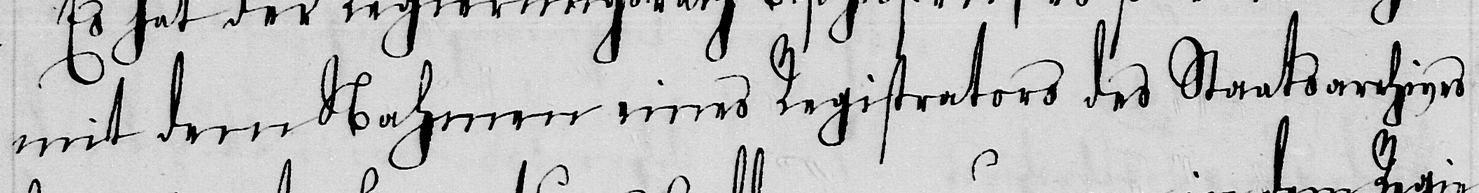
mit dem Nahmen eines Registrators des Staatsarchives
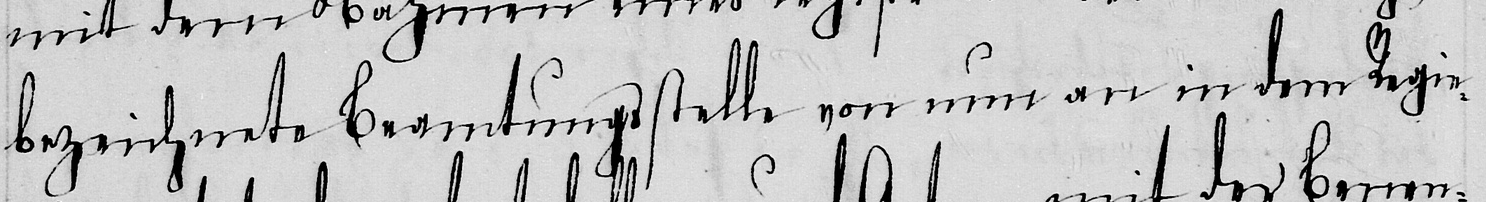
bezeichnete Beamtungsstelle von nun an in dem Regie¬
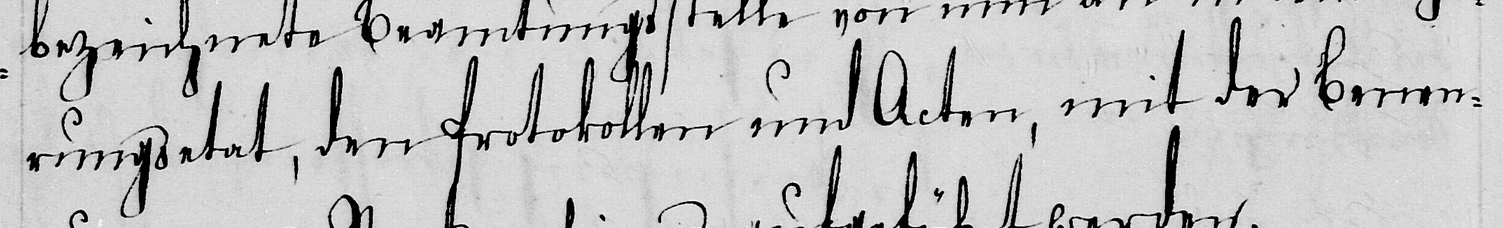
rungsetat, den Protokollen und Acten, mit der Benen¬
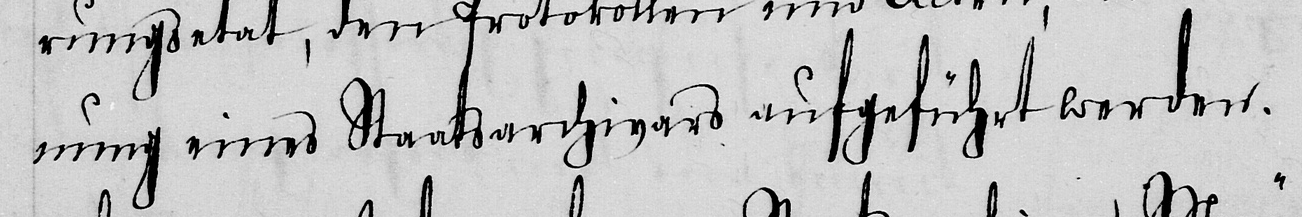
nung eines Staatsarchivars aufgeführt werden.
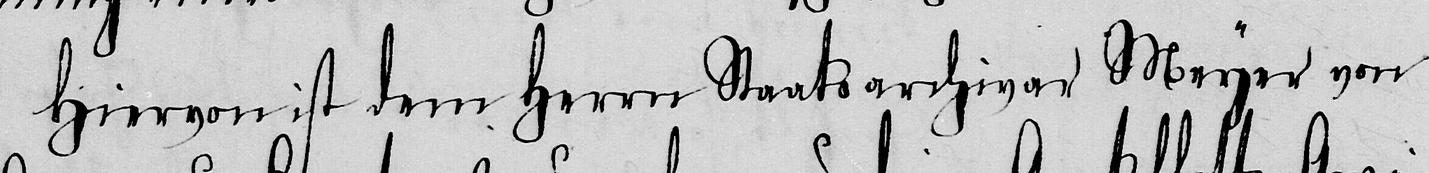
Hiervon ist dem Herrn Staatsarchivar Meyer von
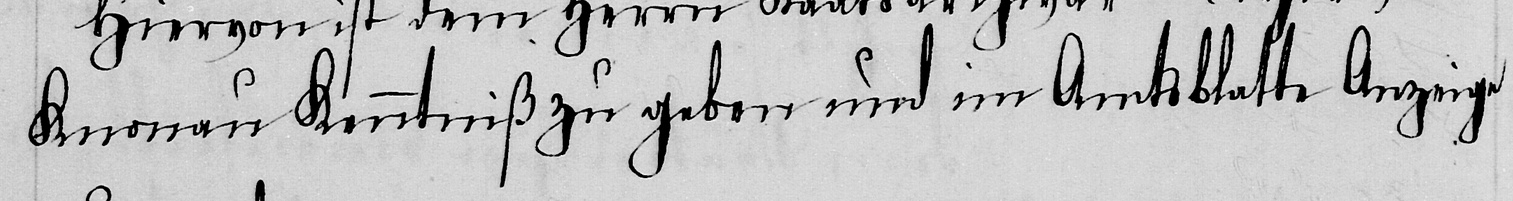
Knonau Kenntniß zu geben und im Amtsblatte Anzeige
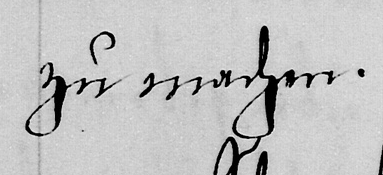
zu machen.
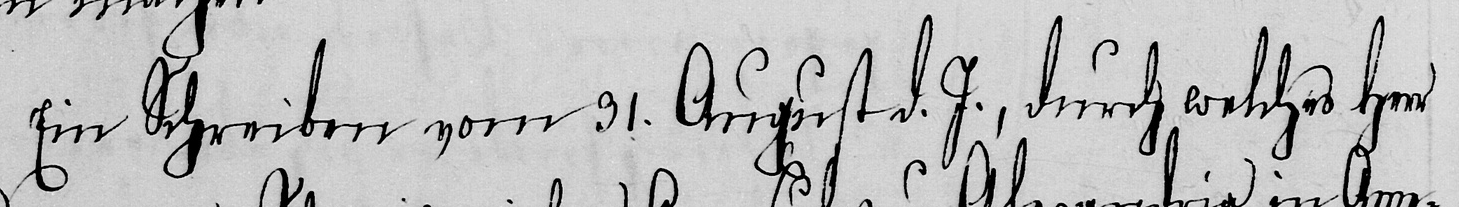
Ein Schreiben vom 31. August d. J., durch welches Her¬
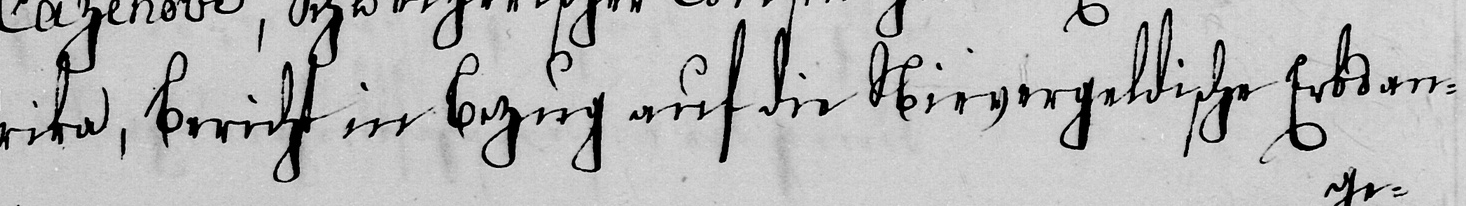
ika, Bericht in Bezug auf die Nievergeldische Erbsan-
